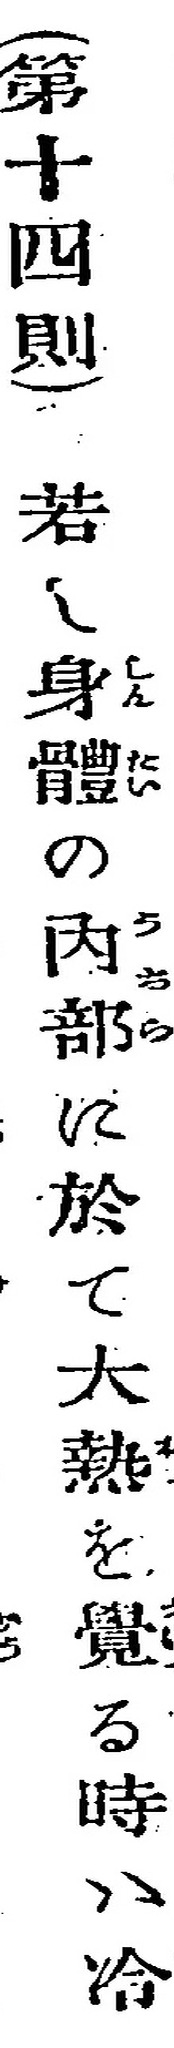[第十四則]若し身體の内部に於て大熱を覺る時は冷
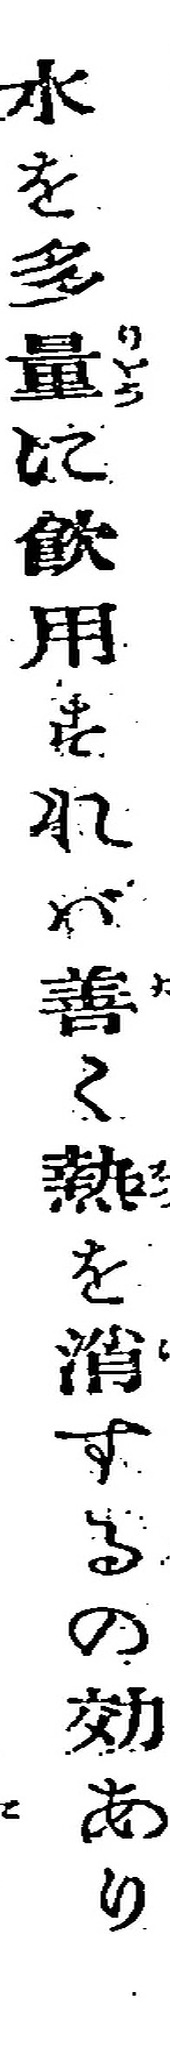水を多量に飲用すれば善く熱を消するの効あり
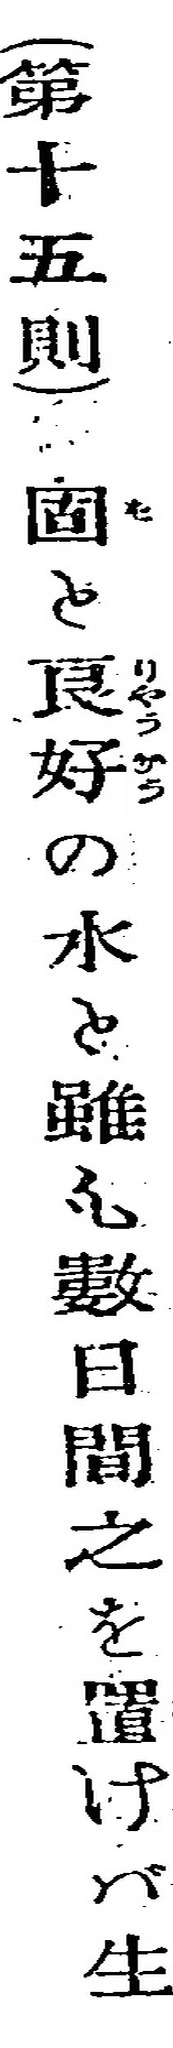[第十五則]固と良好の水と雖も数日間之を置けば生
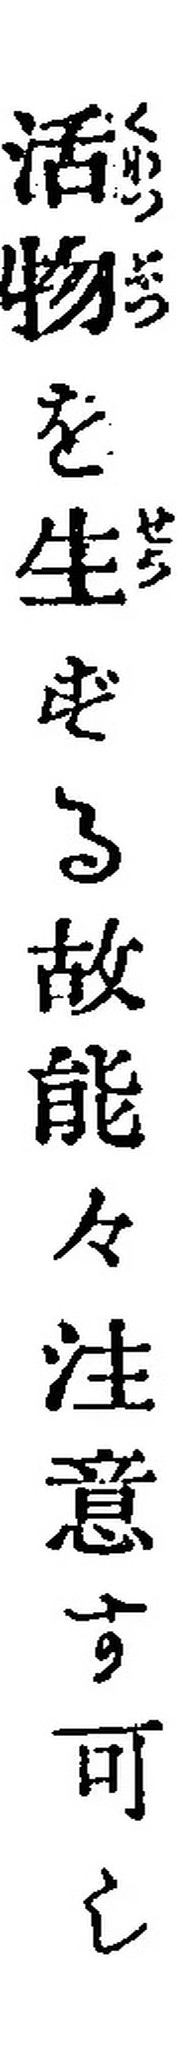活物を生ずる故能々注意す可し
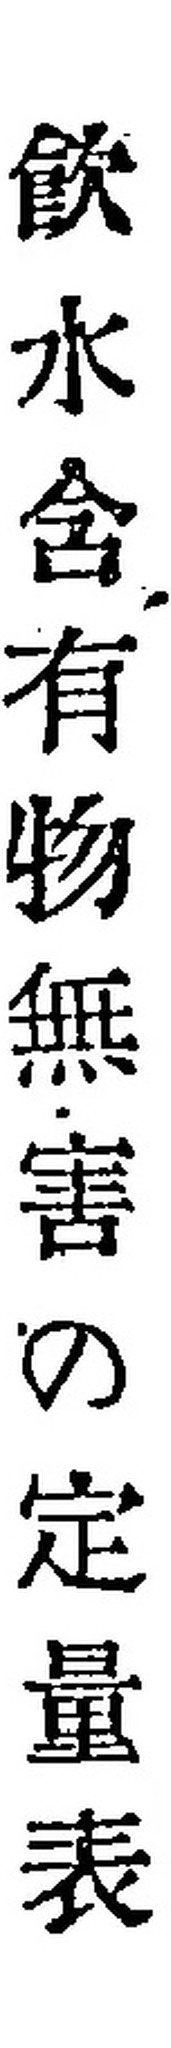飲水含有物無害の定量表
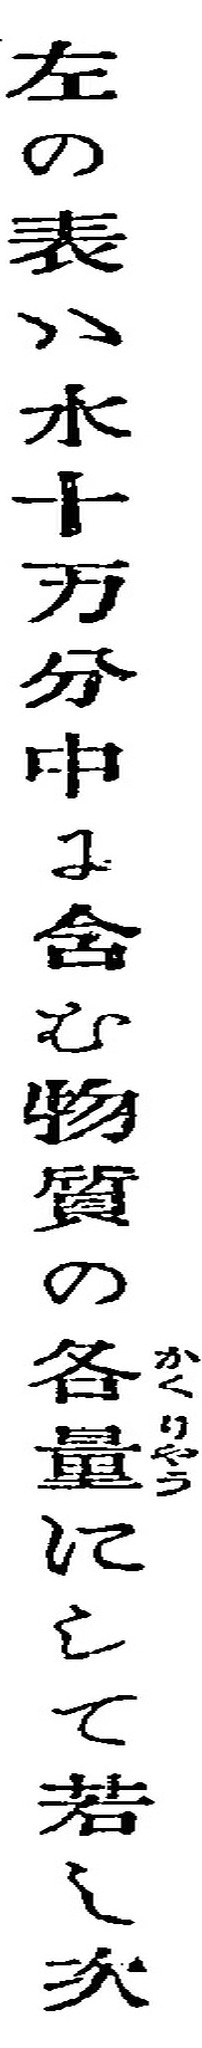左の表は水十万分中に含む物質の各量にして若し次
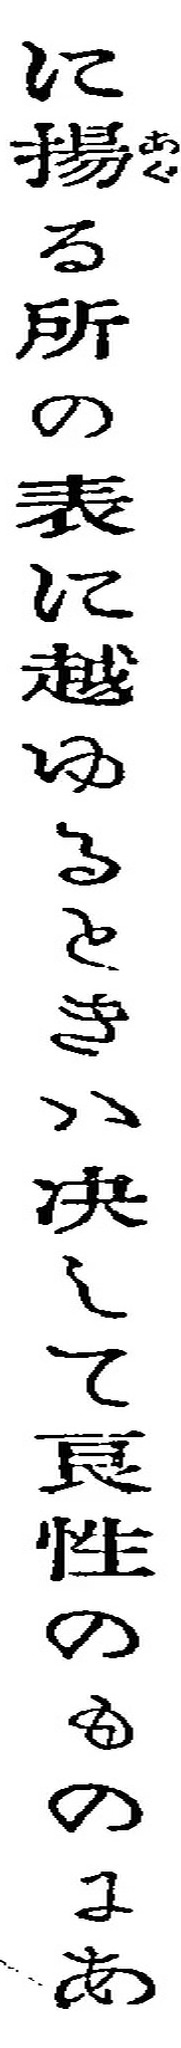に揚る所の表に越ゆるときは決して良性のものにあ
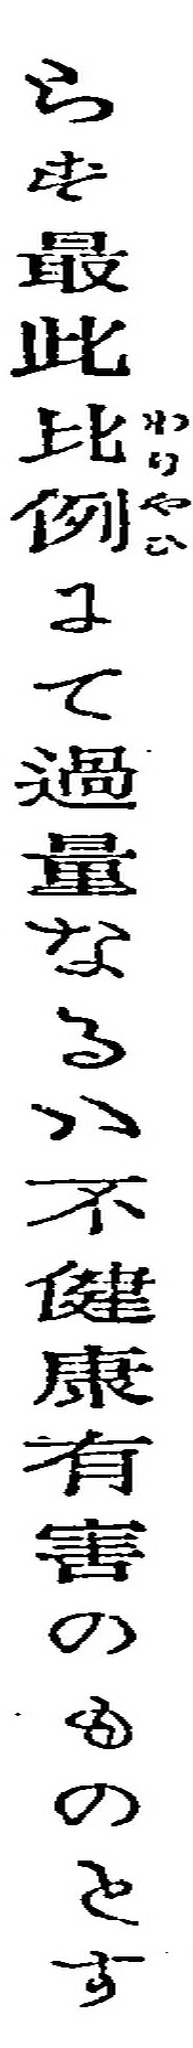らず最此比例にて過量なるは不健康有害のものとす

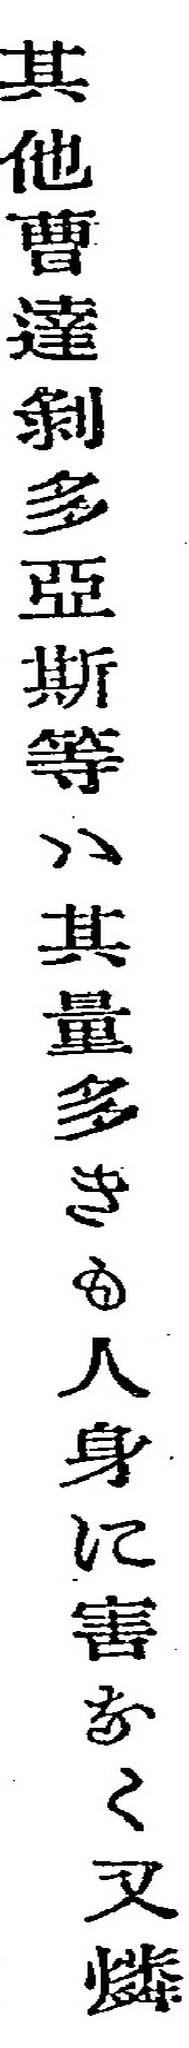其他曹達剥多亞瓦斯等は其量多きも人身に害なく又燐
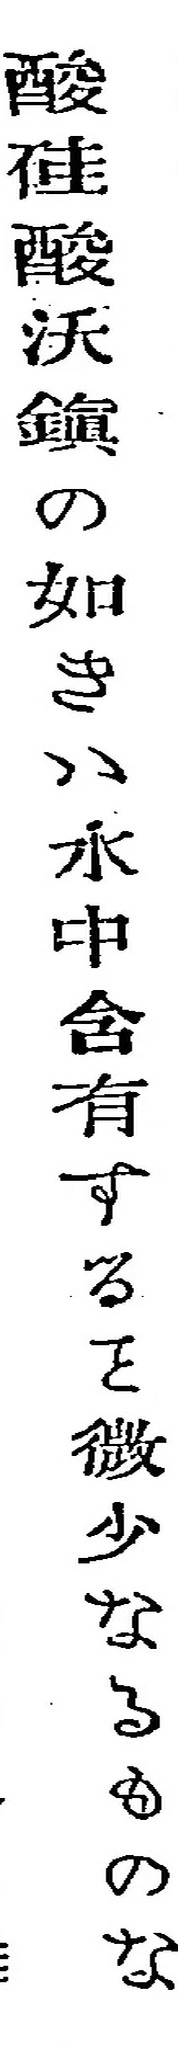酸珪酸沃鎭の如きは水中含有すること微少なるものな
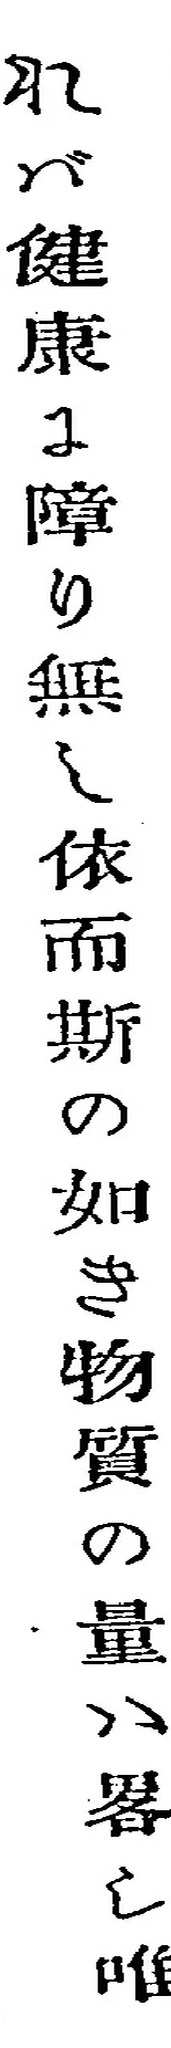れば健康に障り無し依而斯の如き物質の量は畧し唯
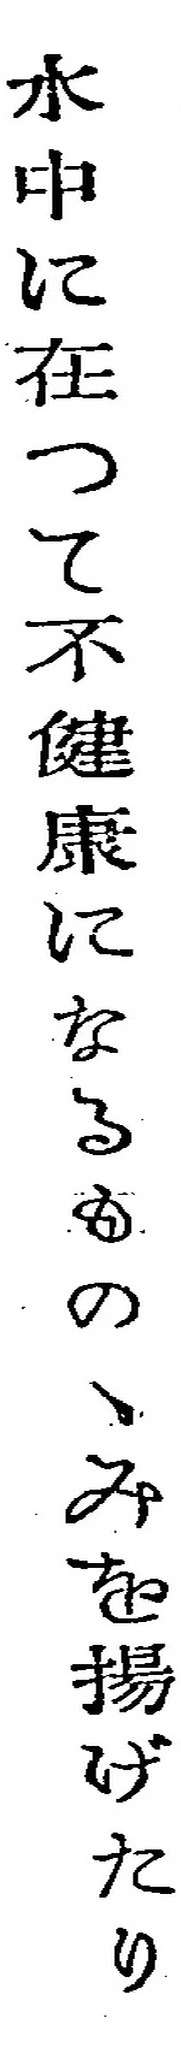水中に在つて不健康になるものゝみを揚げたり

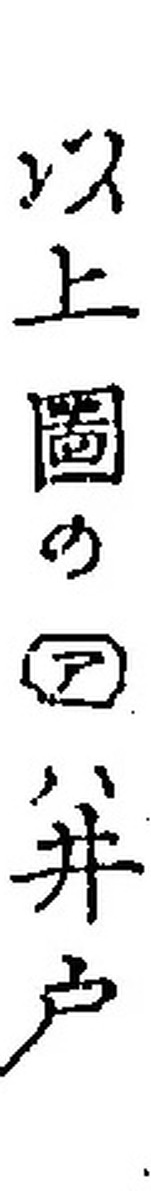以上圖のアは井戸
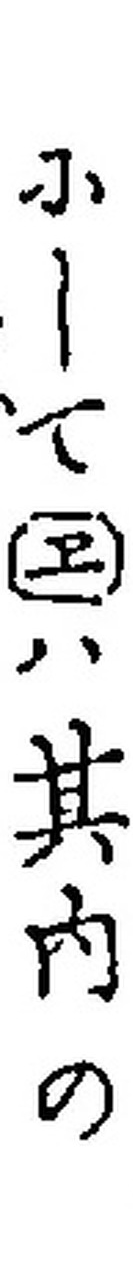にしてヱは其内の
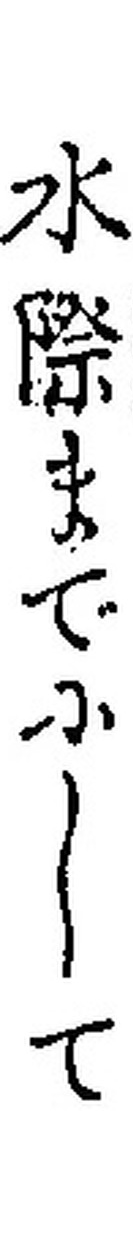水際までにして
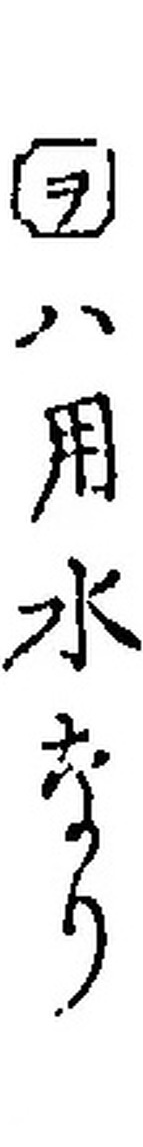ヲは用水なり
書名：飲水の心得 : 伝染病の予防
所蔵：国立国会図書館 National Diet Library, JAPAN
